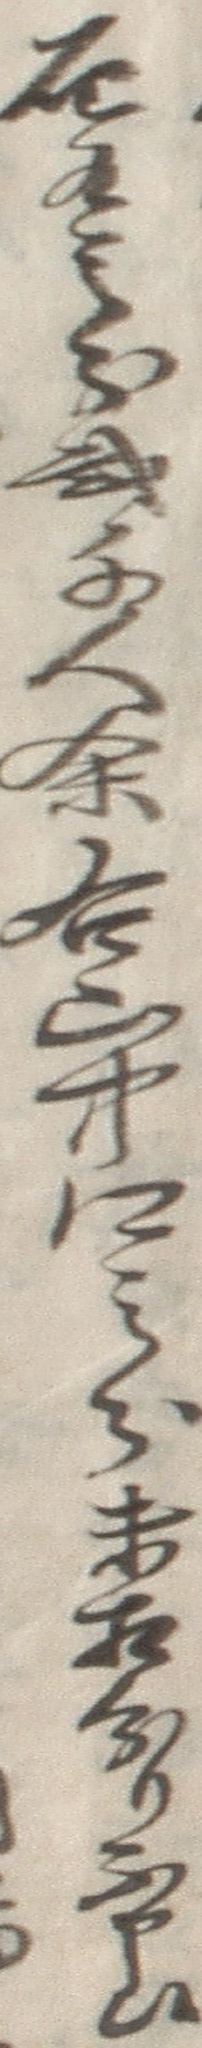届有之分弐千人余右山中郷之分未相分不申候
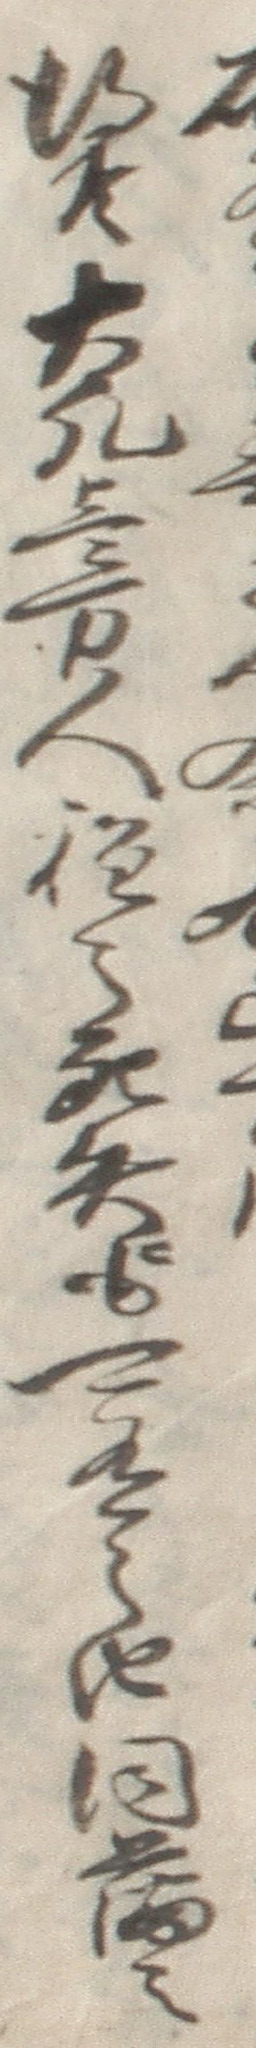得共大凡壱万人程之死失二も可有之由同藩之
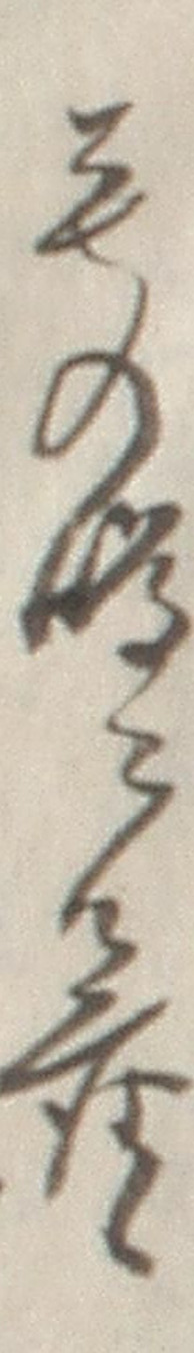もの噂二御座候
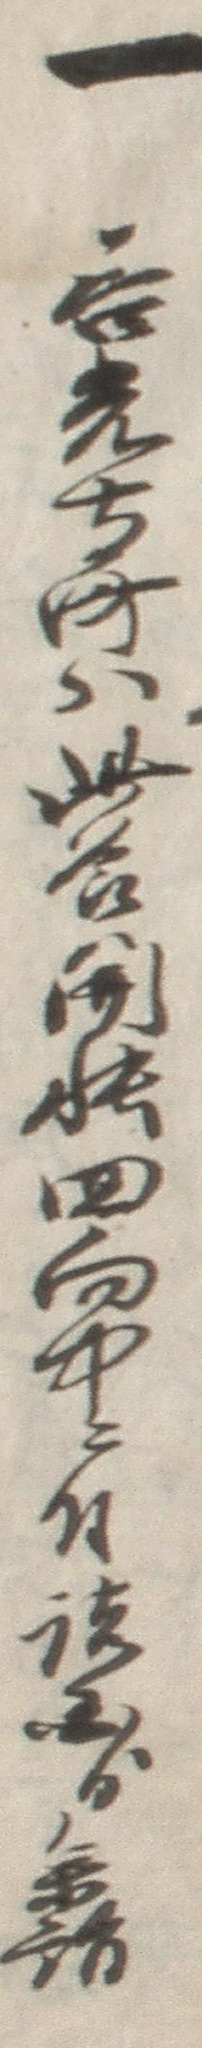一善光寺町ハ此節開帳回向中二付諸国ゟ参詣

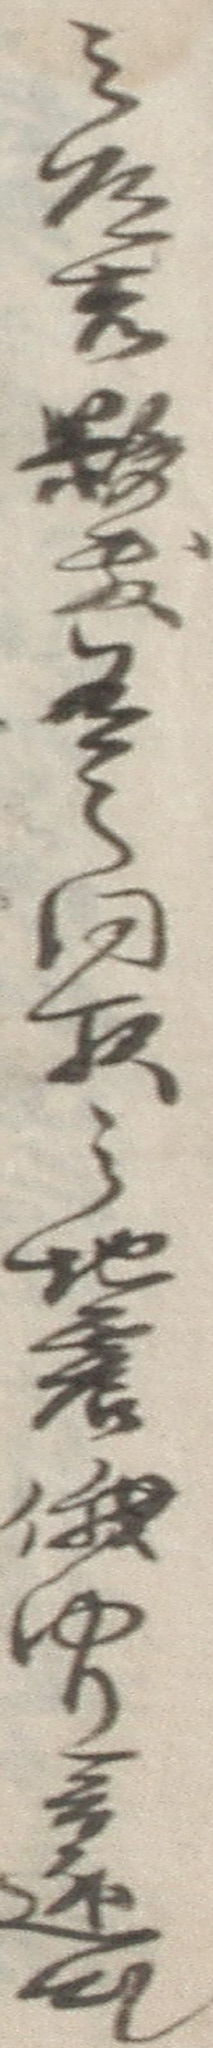之道者夥敷有之同夜之地震俄ゆり二而逃出し
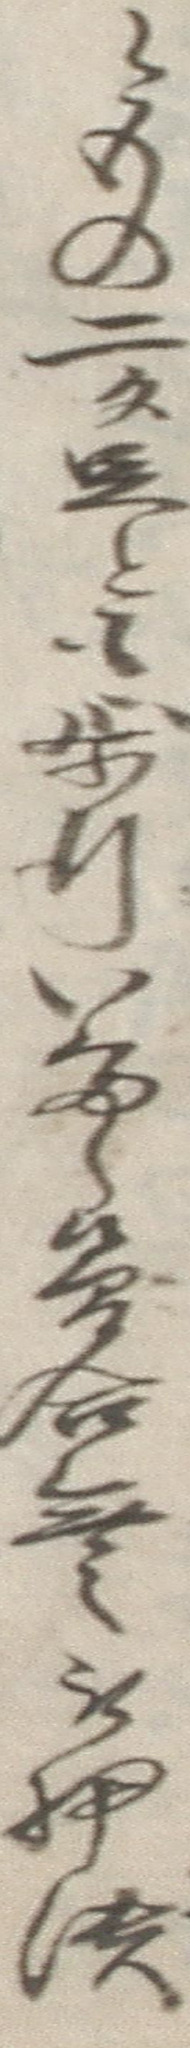候もの二タ足とも歩行いたし候間合無之被押潰
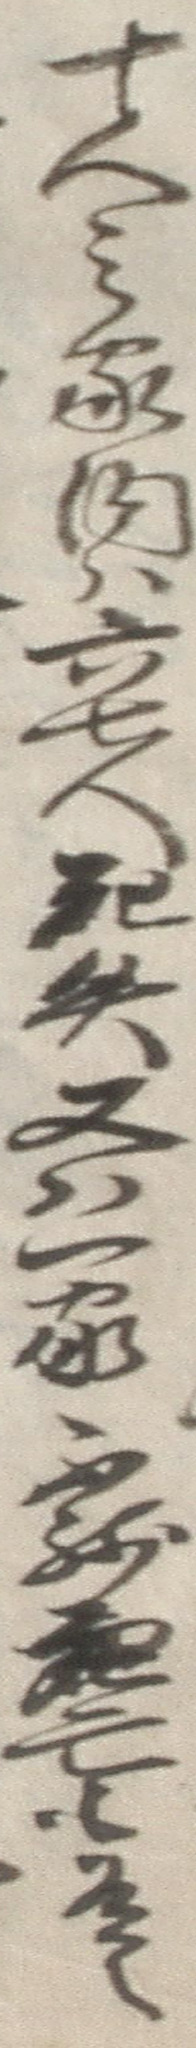十人之家内ハ六七人死失又ハ一家不残死亡も有之
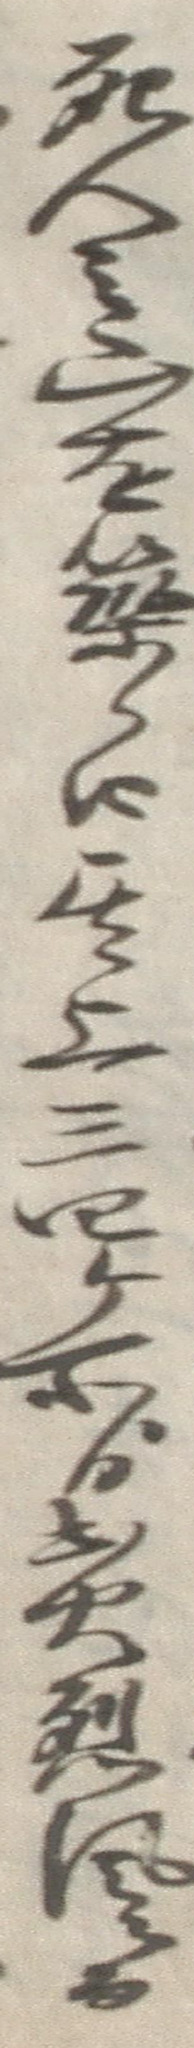死人之山を築候由其上三四ヶ所ゟ出火烈風二而
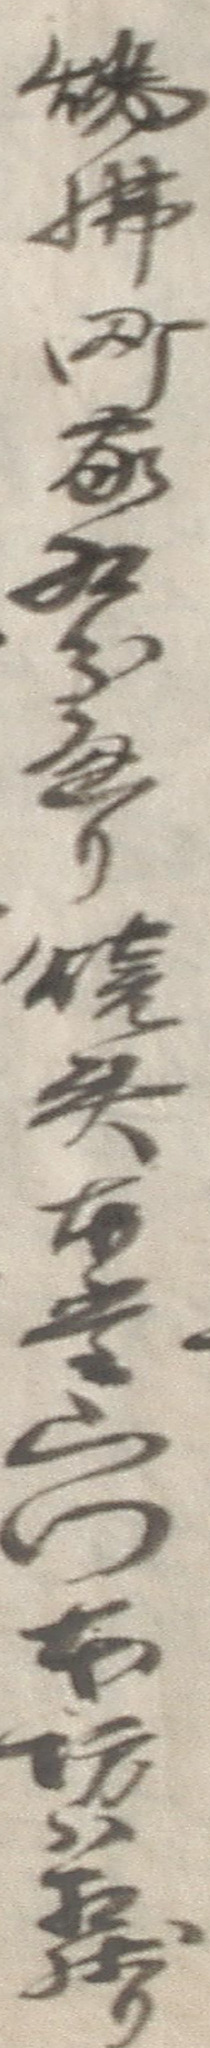焼払町家九分通り焼失本堂山門本坊ハ相残り
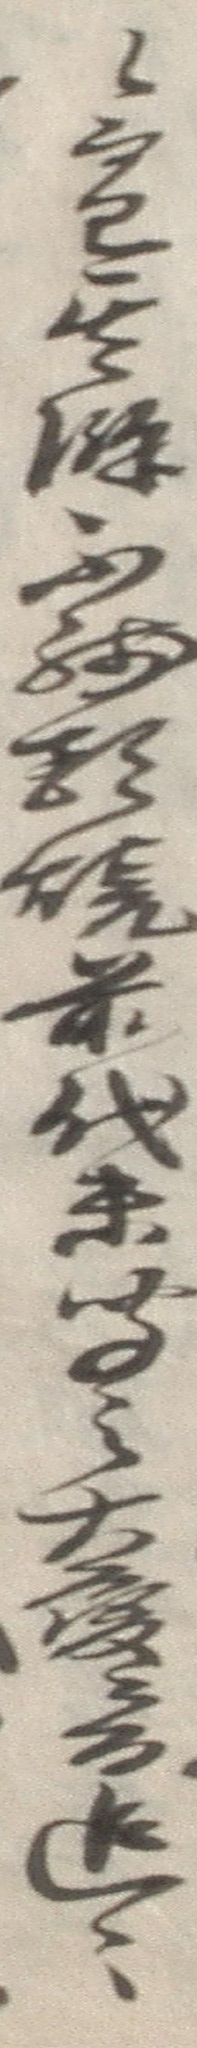候而巳其餘不残類焼前代未聞之大変二而追々
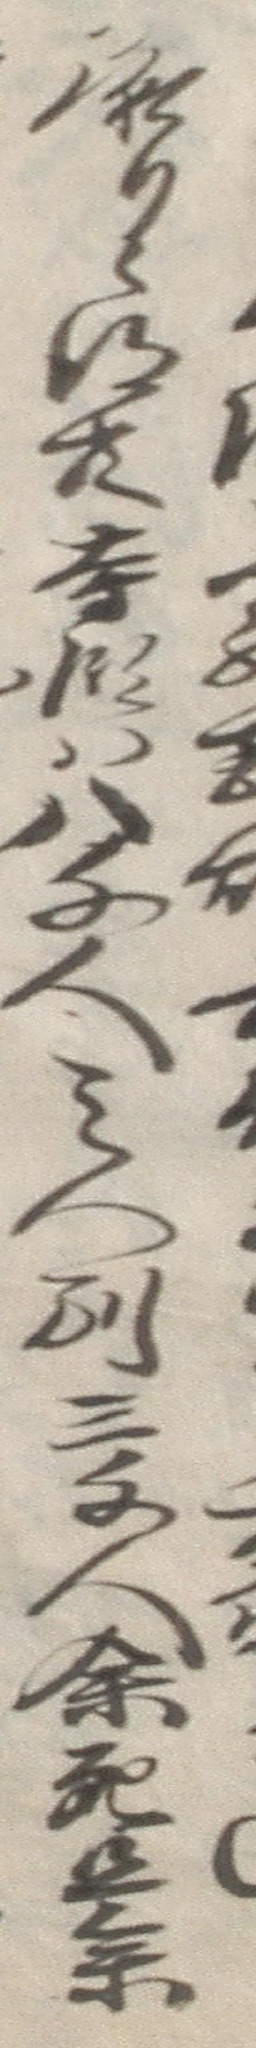承り候得共寺領ハ八千人之人別三千人余死且参
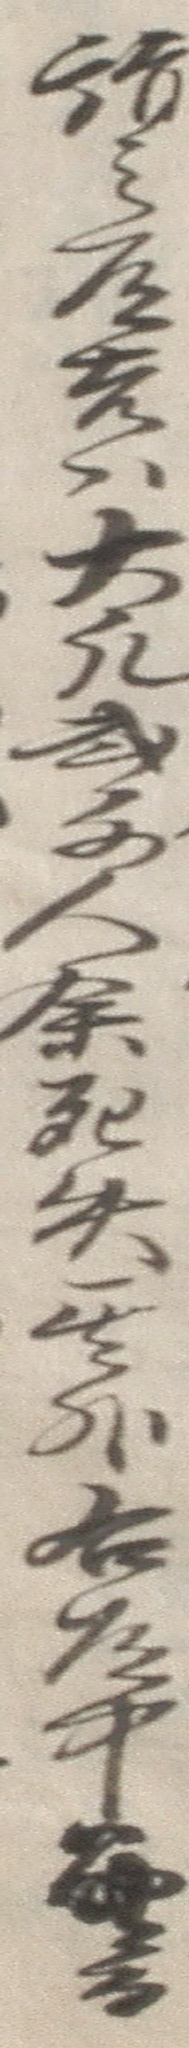詣之道者ハ大凡弐千人余死失其外右道中筋二而
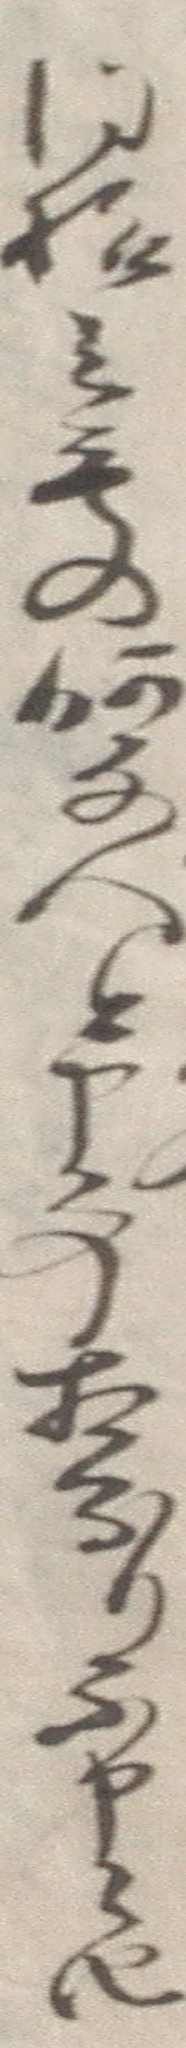同様之もの何千人と申事相分り不申候由
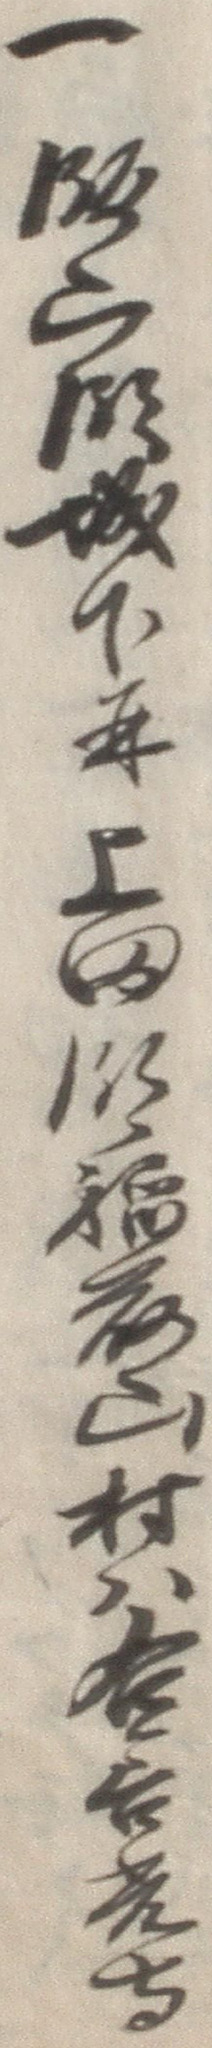一飯山領城下并上田領稲荷山村ハ右善光寺
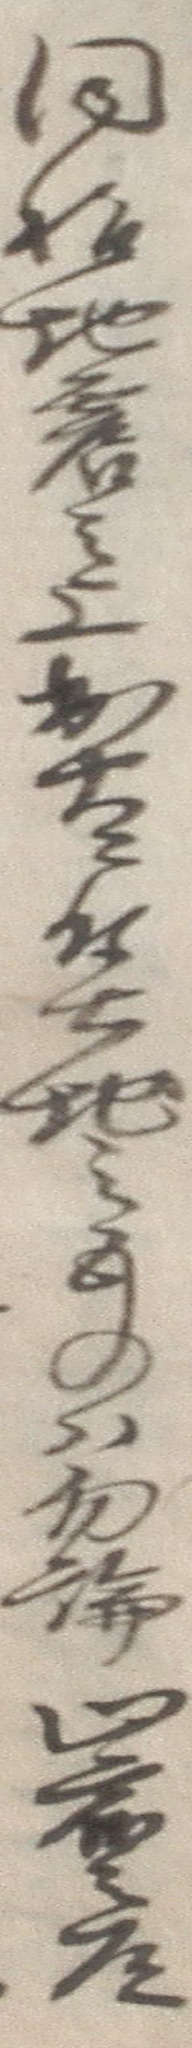同様地震之上出火二付土地之ものハ勿論止宿之道
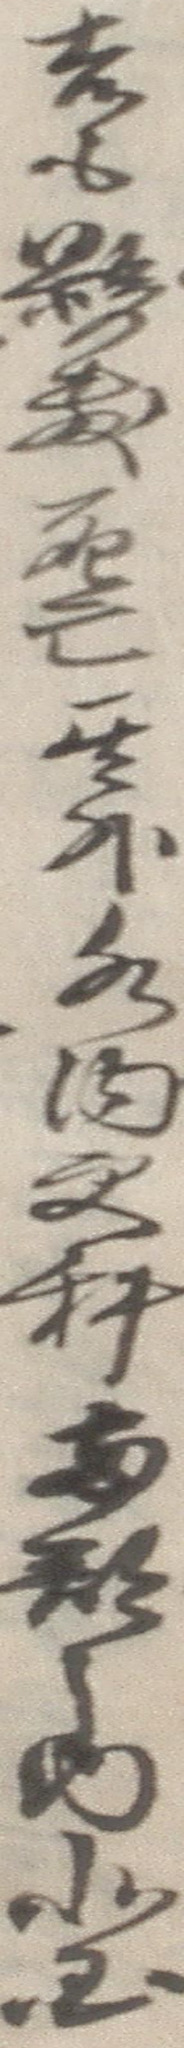者も夥敷死亡其外水内更級両郡之内北国
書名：信州地震一件
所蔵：東京大学地震研究所図書室 Earthquake Research Institute Library, The University of Tokyo, JAPAN
